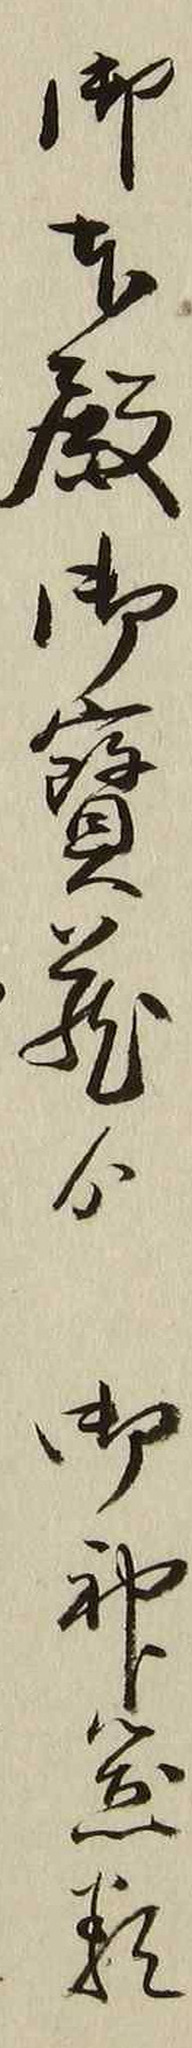御本殿御宝蔵ゟ御神器類
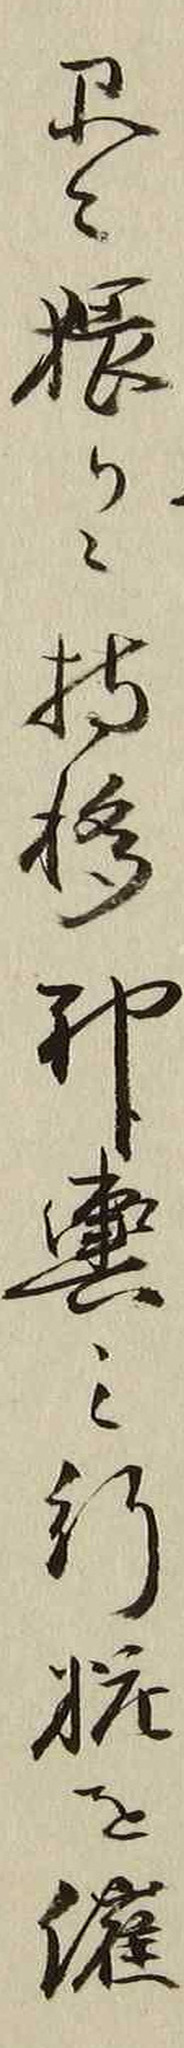品々猥りニ持移神輿之行粧を催
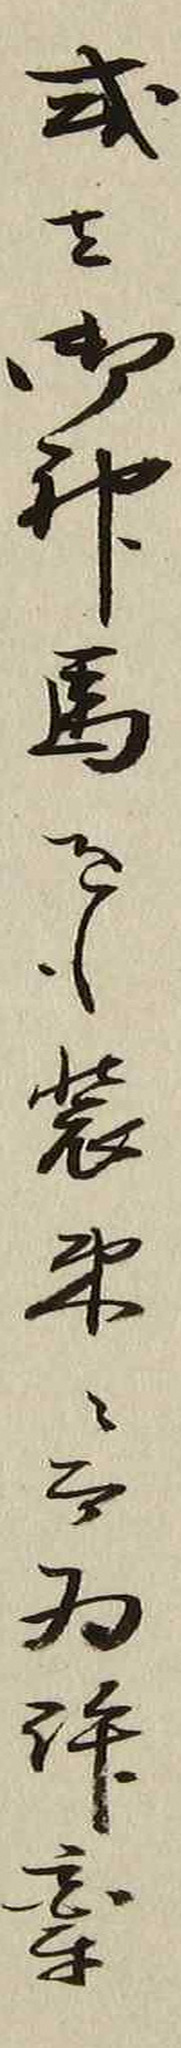或者御神馬をも装束ニ而為許牽
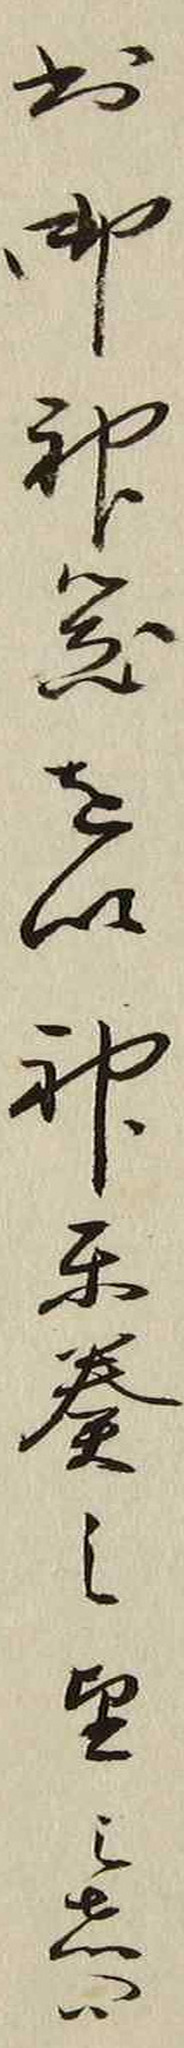出御神器を以神楽奏之望之者へハ
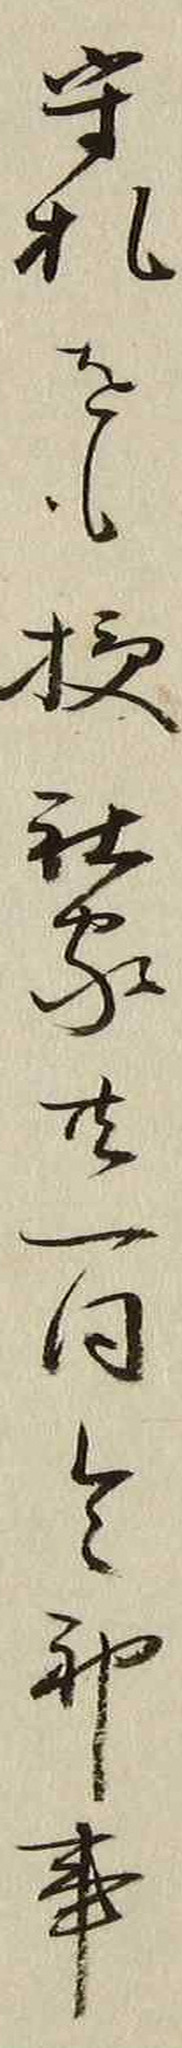守札をも授社家共一同令神事
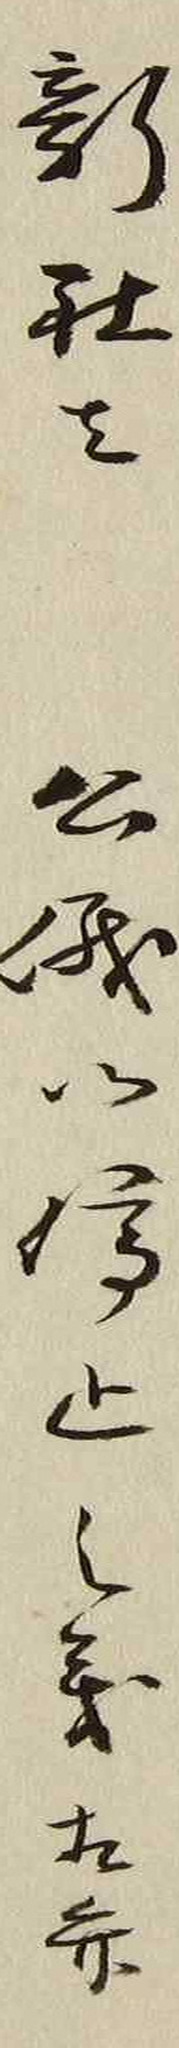新社者公儀御停止之義相弁
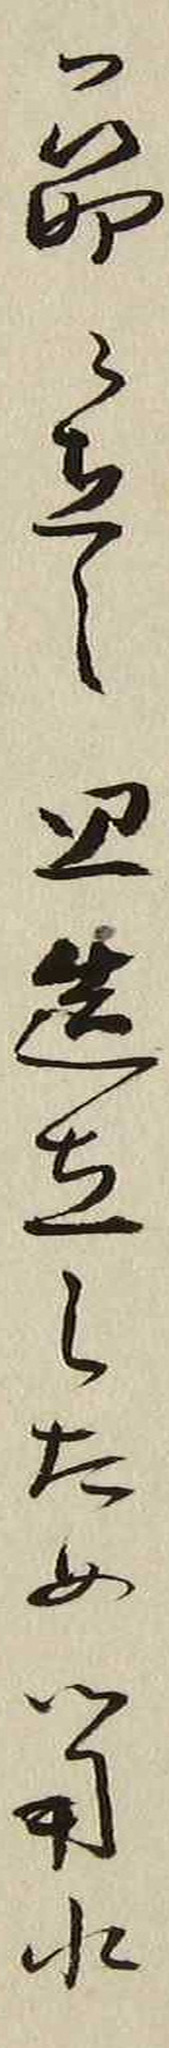候筋ニ在之且造立之ため御用水
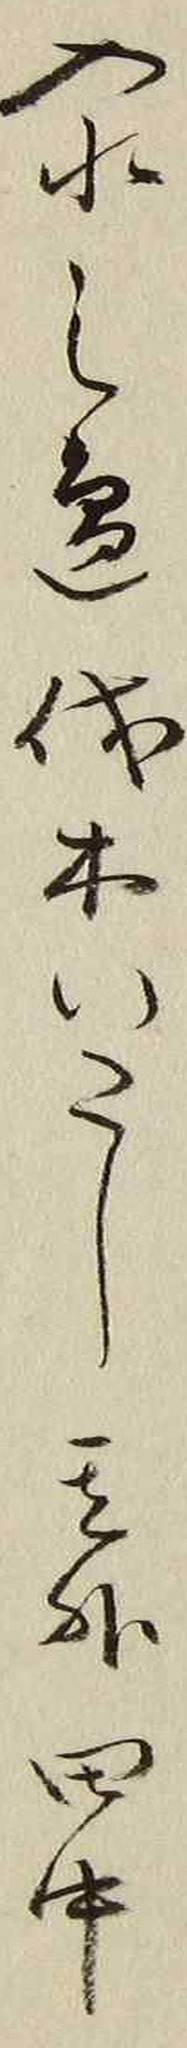入水之辺伐木いたし其外田中
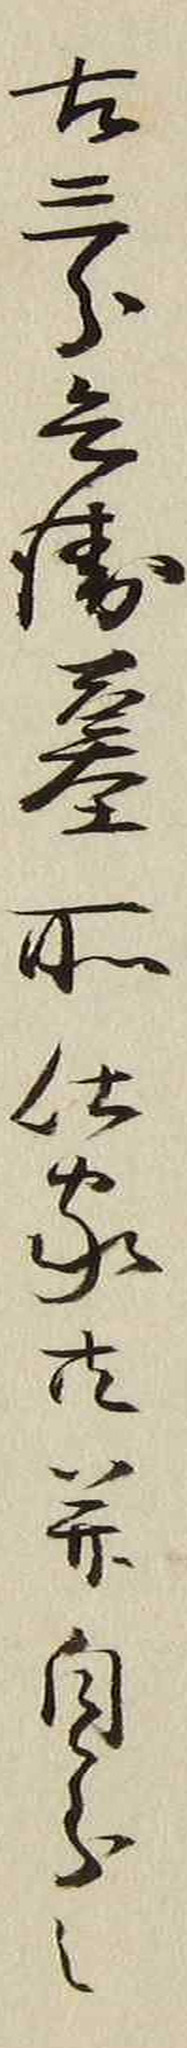右三郎兵衛墓所仕家共并自分之
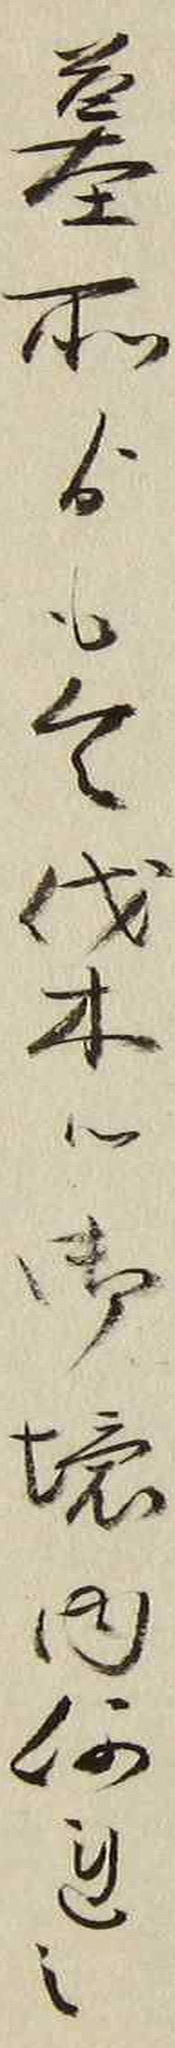墓所ゟも令伐木候御境内何れ之
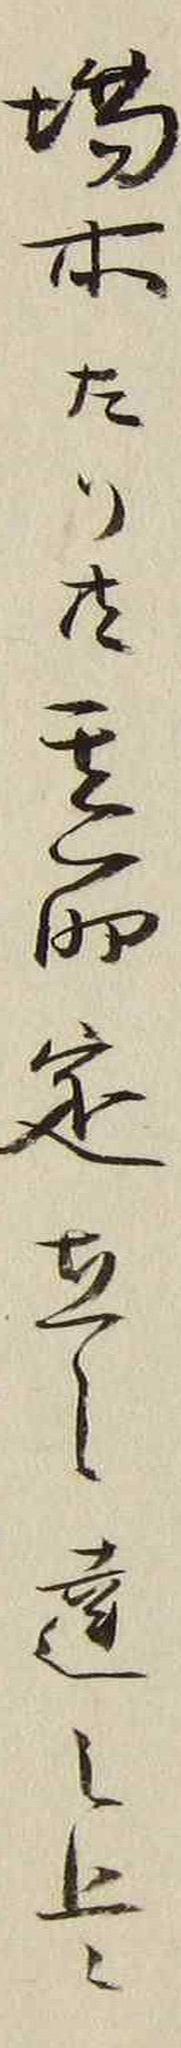場所たり共其筋定在之達之上ニ
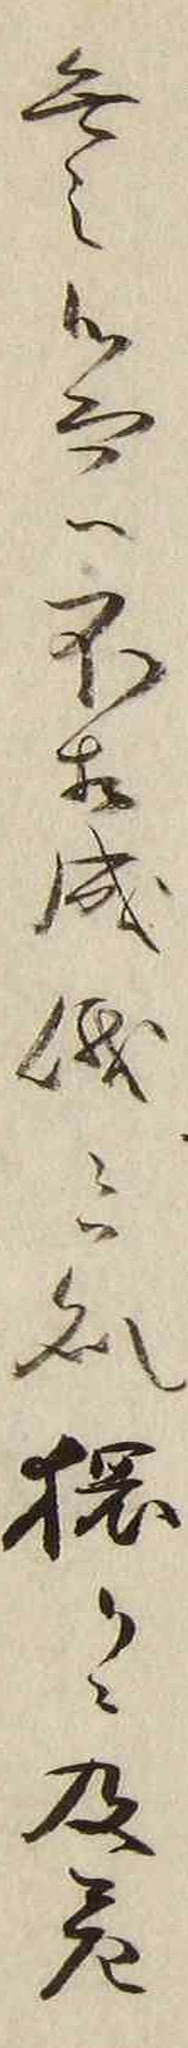無之候而ハ不相成儀ニ候処猥りニ及差

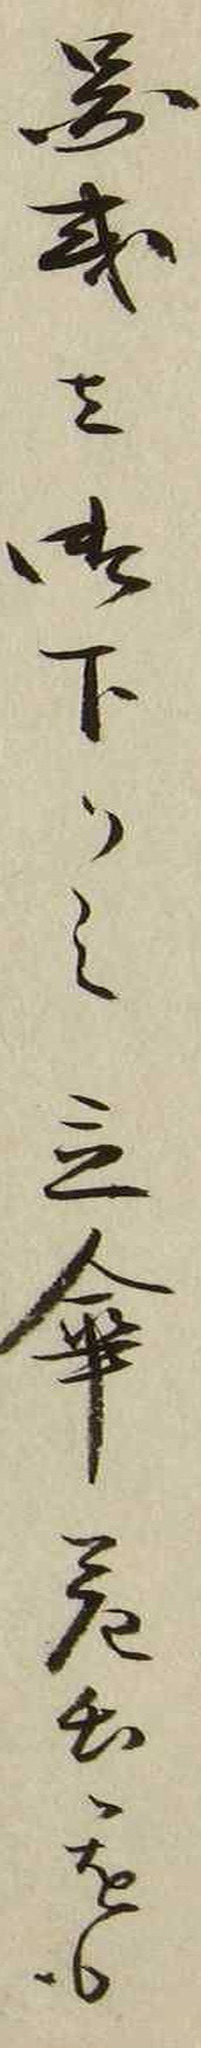図或者御下り之立傘差出候をも
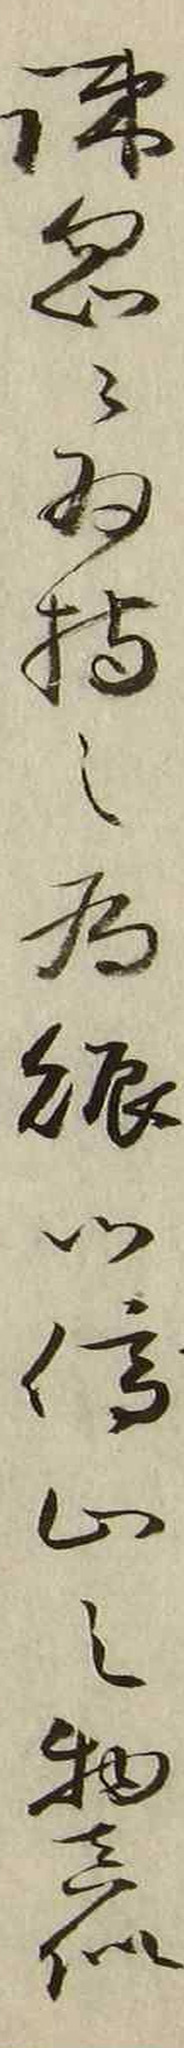疎忽ニ為持之為賑御停止之物真似
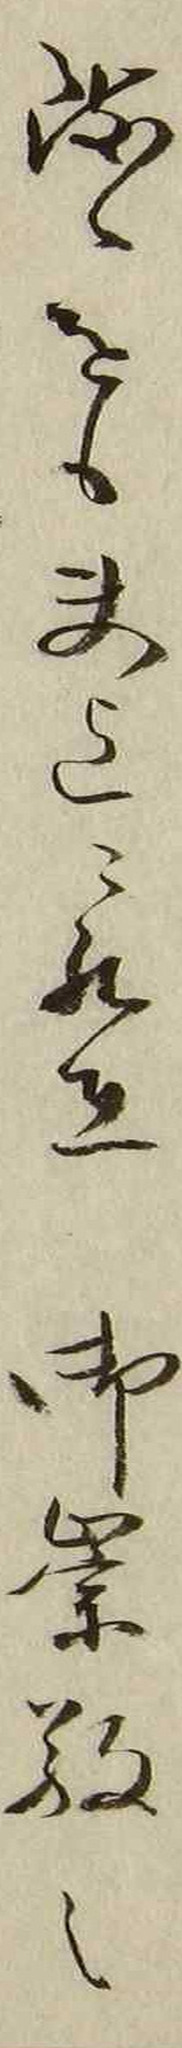致候をも夫迄ニ罷在御崇敬之
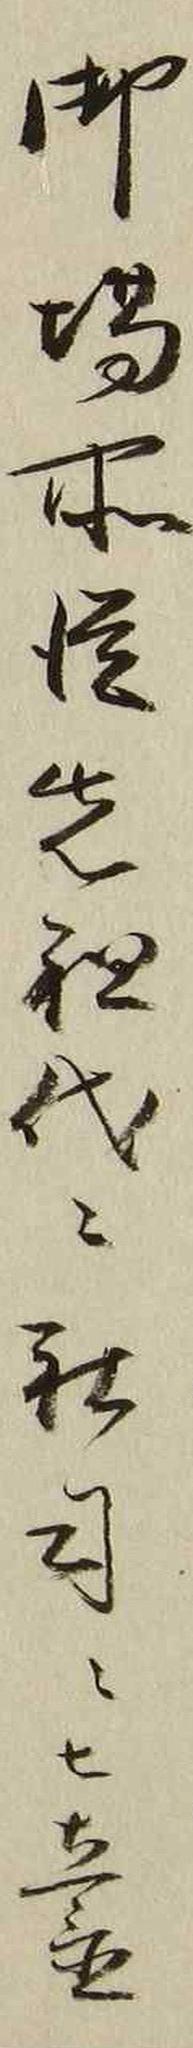御場所従先祖代々社司ニ被立置
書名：諸士系譜　巻之291　さ之部23
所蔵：会津若松市立会津図書館
